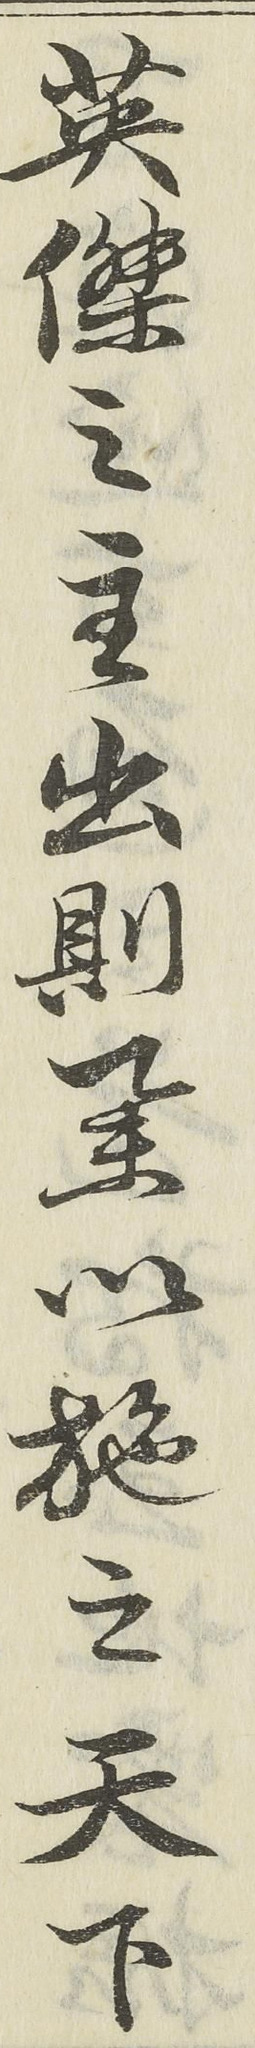英傑之主出則挙以施之天下
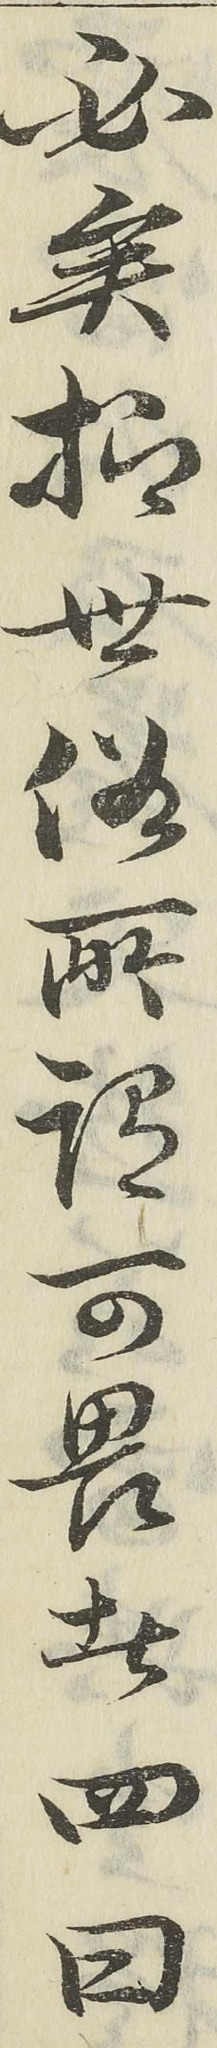必矣抑世俗所謂可畏者四曰

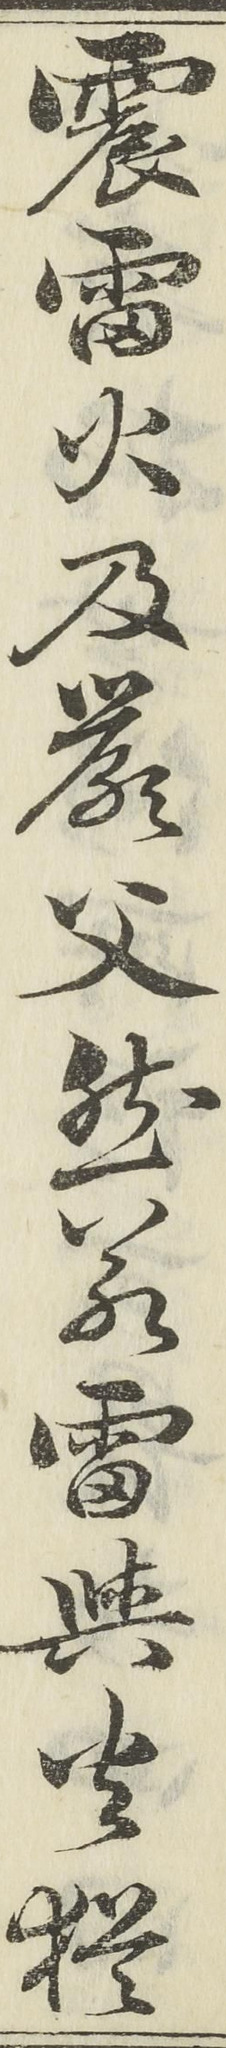震雷火及厳父然若雷与火猶
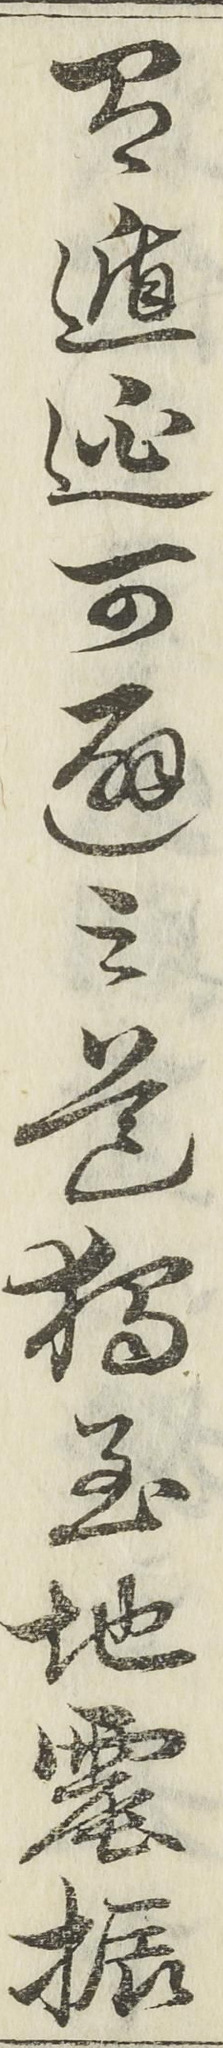有遁逃可避之道独至地震振
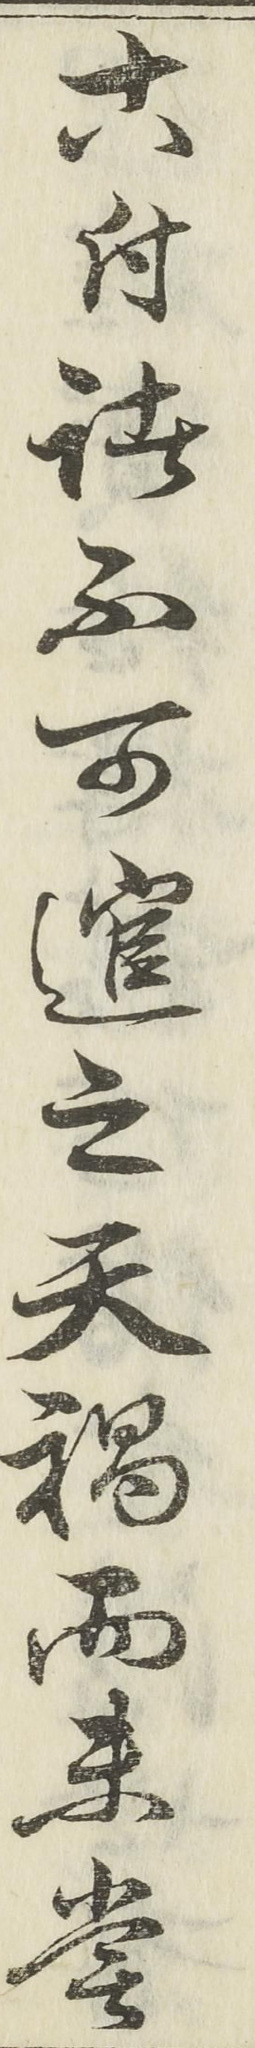古付諸不可逭之天禍而未嘗
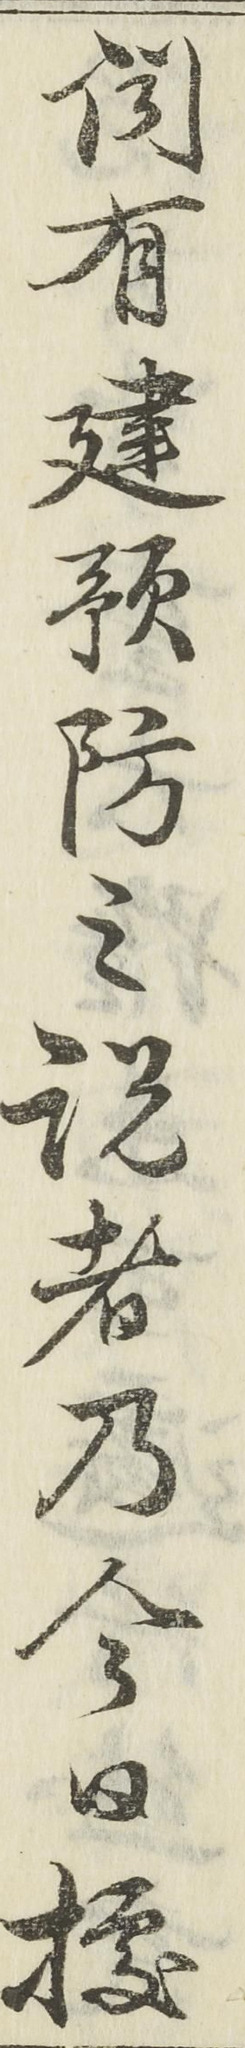聞有建預防之説者乃今日拠
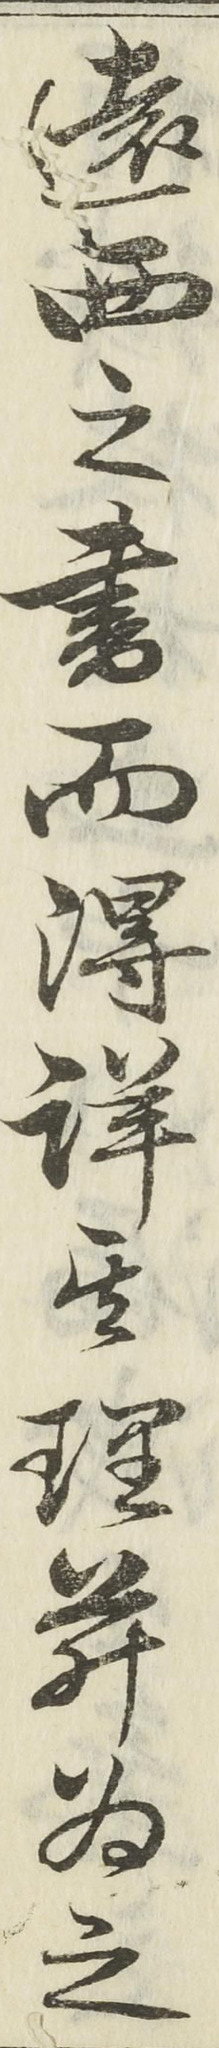遠西之書而得詳其理并為之
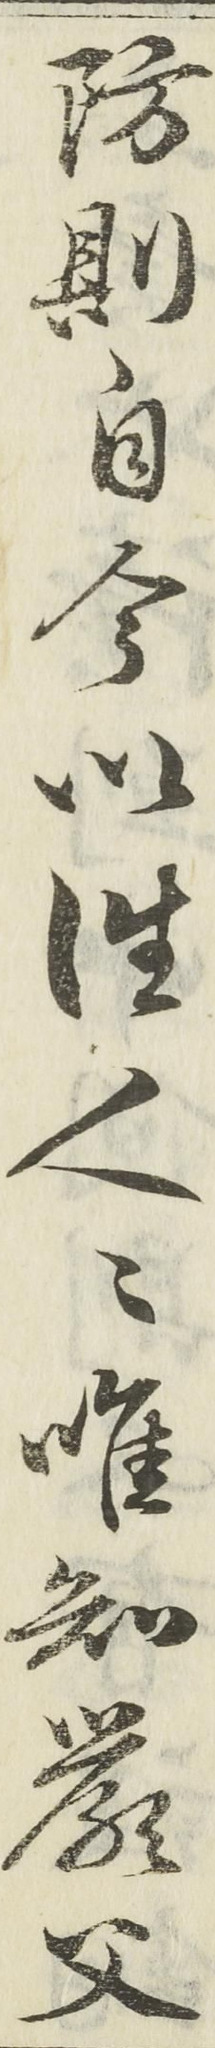防則自今以往人々唯知厳父
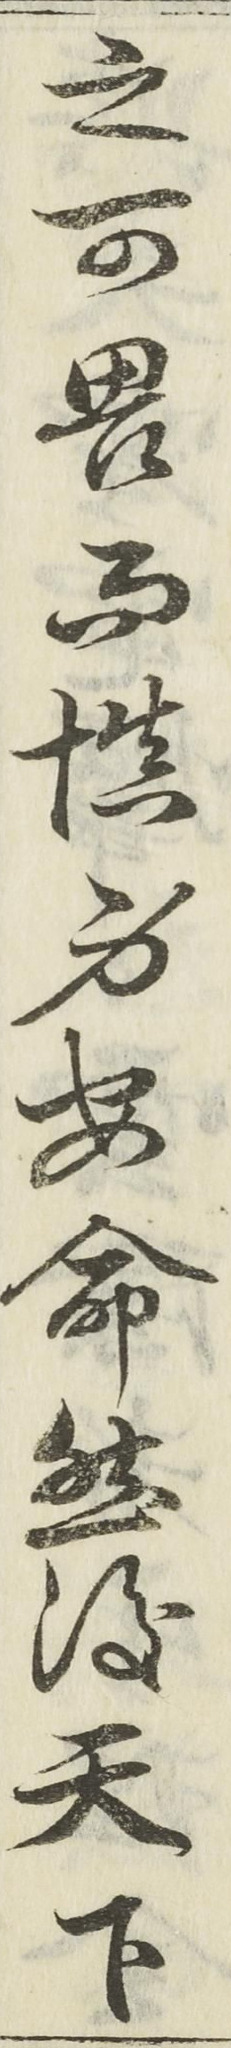之可畏而慎身安命然後天下
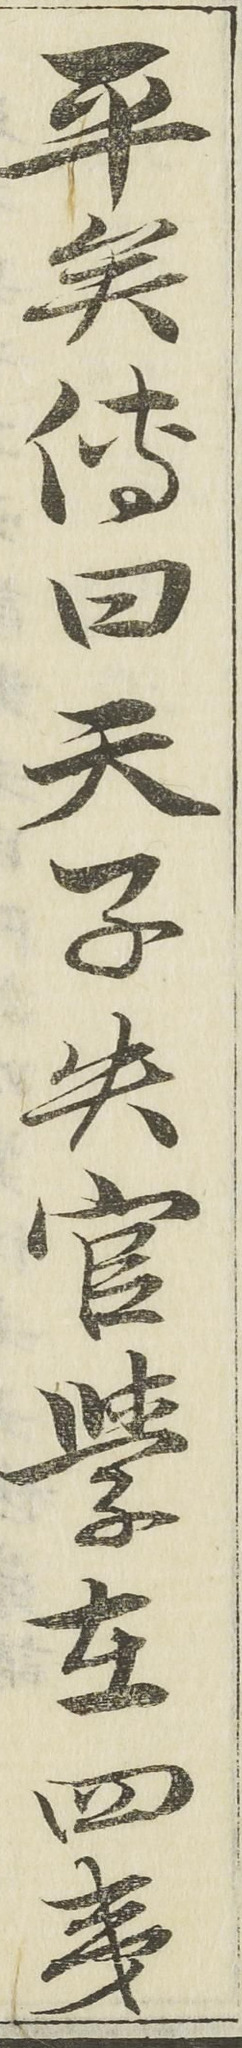平矣伝曰天子失官学在四夷
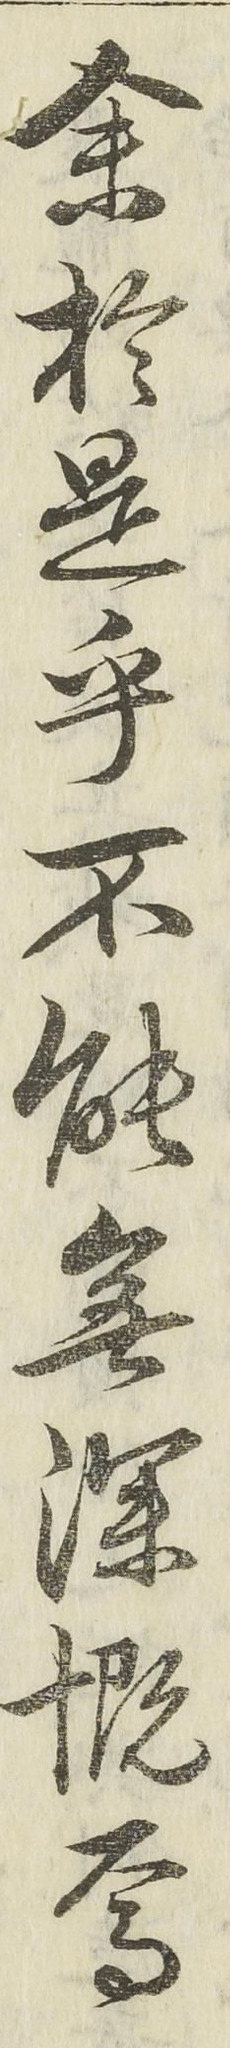余於是乎不能無深慨焉
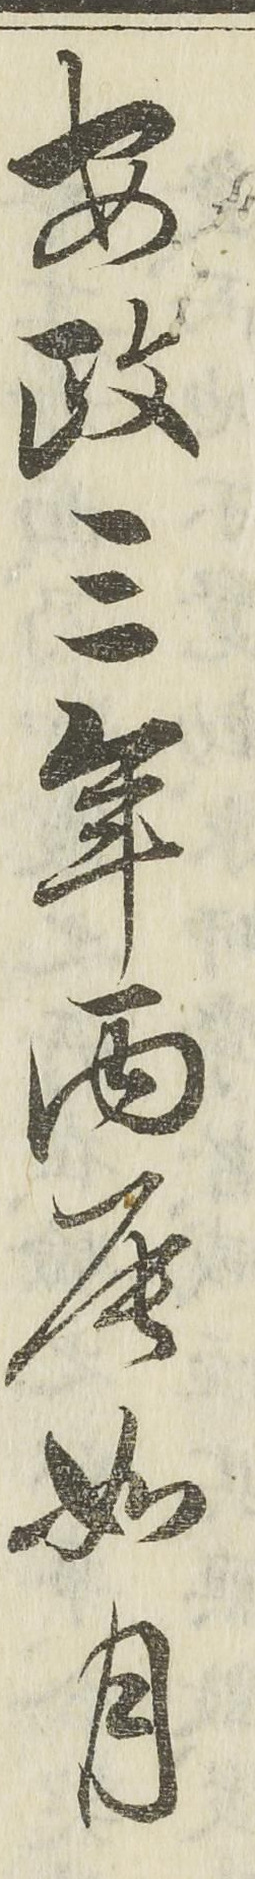安政三年丙辰如月
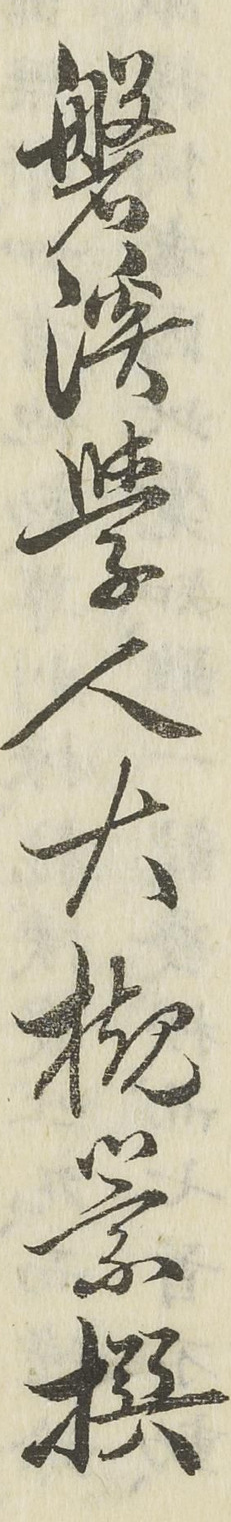磐溪学人大槻崇撰

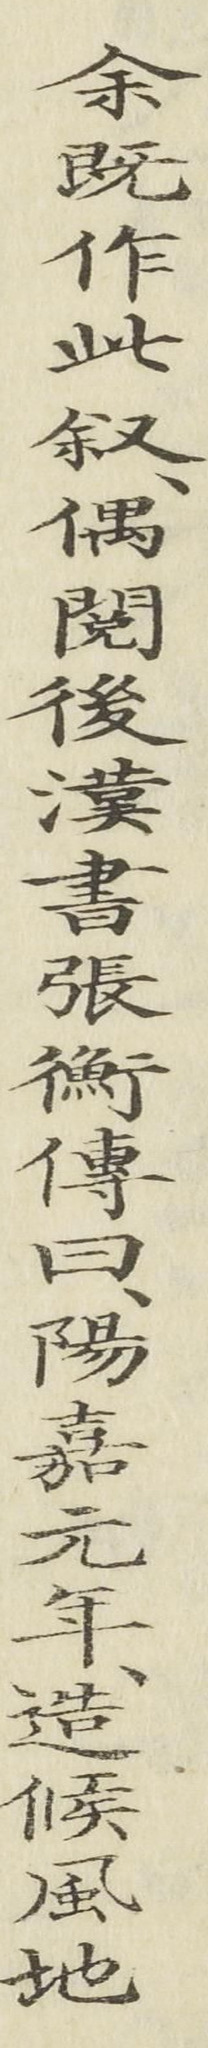余既作此叙、偶閲後漢書張衡伝曰、陽嘉元年、造候風地
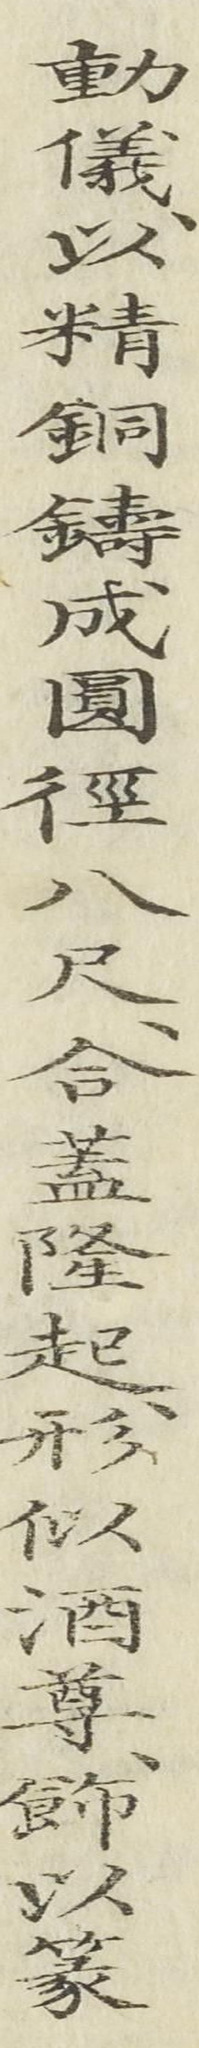動儀、以精銅鑄成円徑八尺、合蓋隆起、形以酒尊、飾以篆
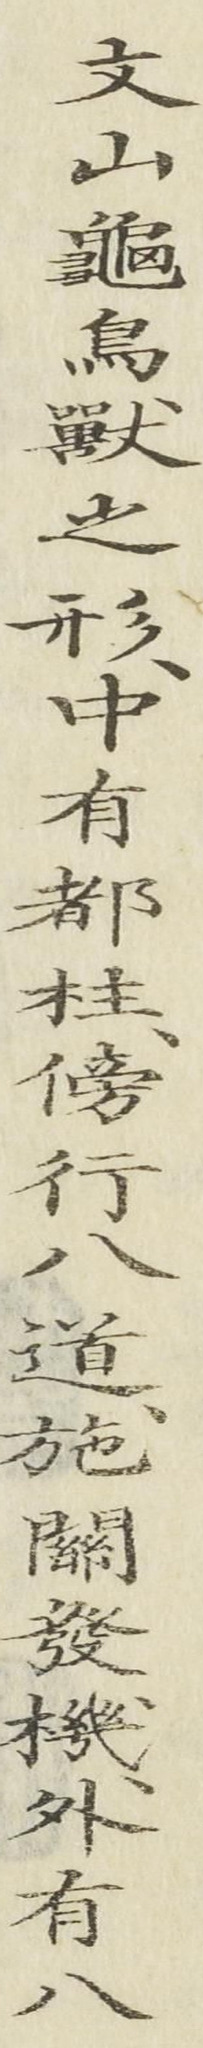文山亀鳥獣之形、中有都柱、傍行八道、施関発機、外有八
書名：地震預防説
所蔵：東京大学地震研究所図書室 Earthquake Research Institute Library, The University of Tokyo, JAPAN
